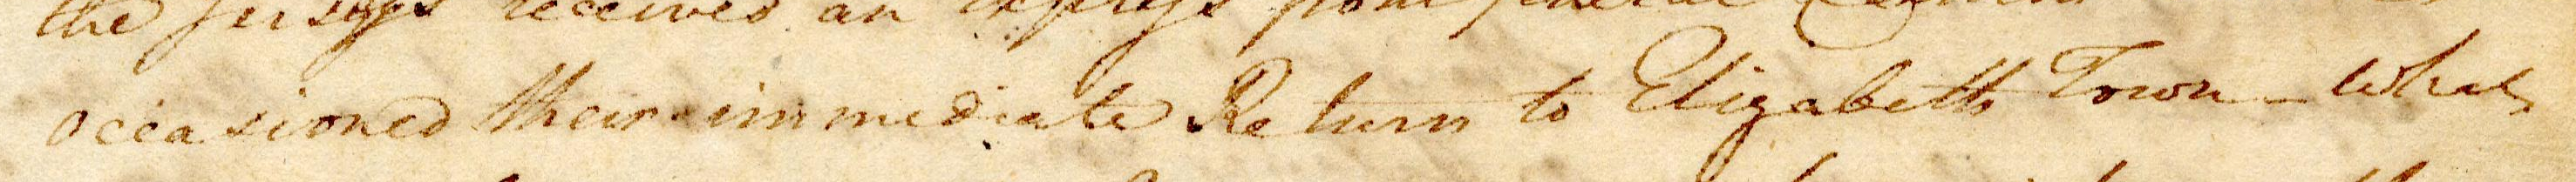occasioned their immediate Return to Elizabeth Town- what
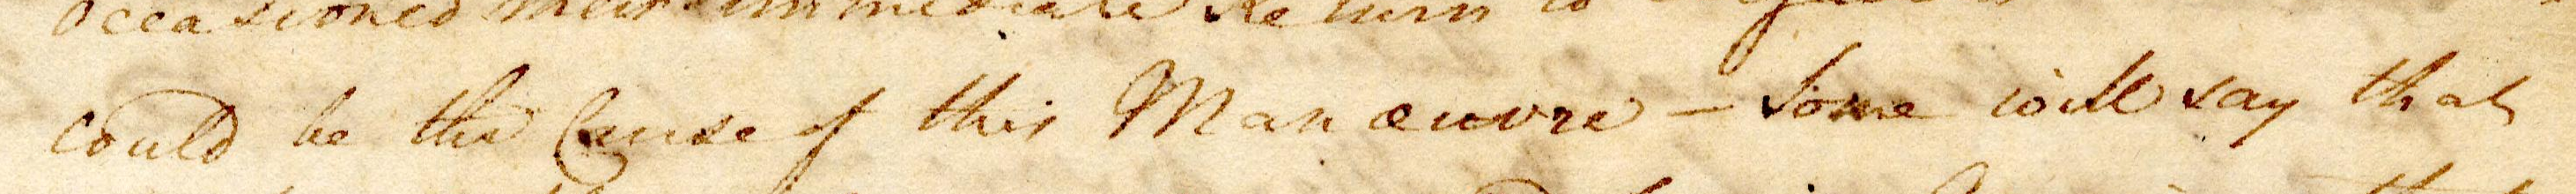could be the Cause of this Manoeuvre. Some will say that
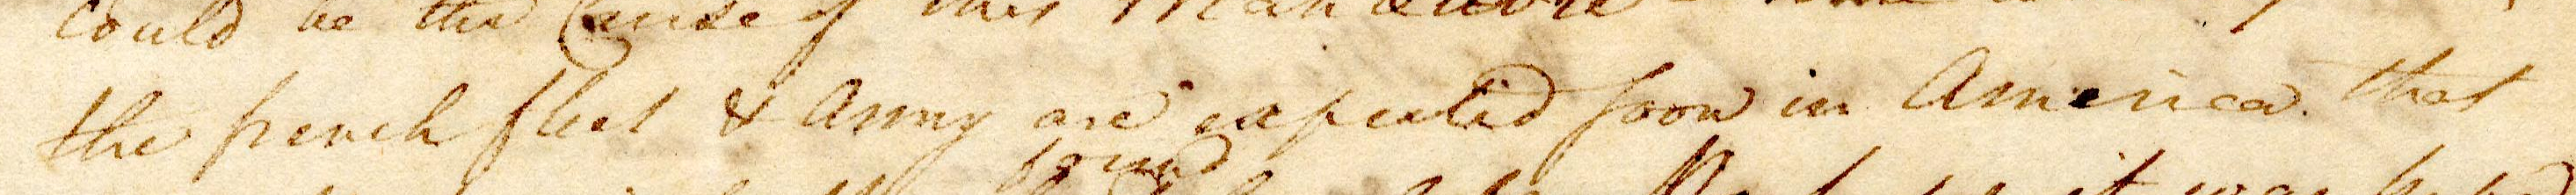the french fleet & Army are expected soon in America that
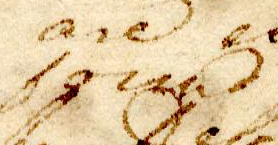found
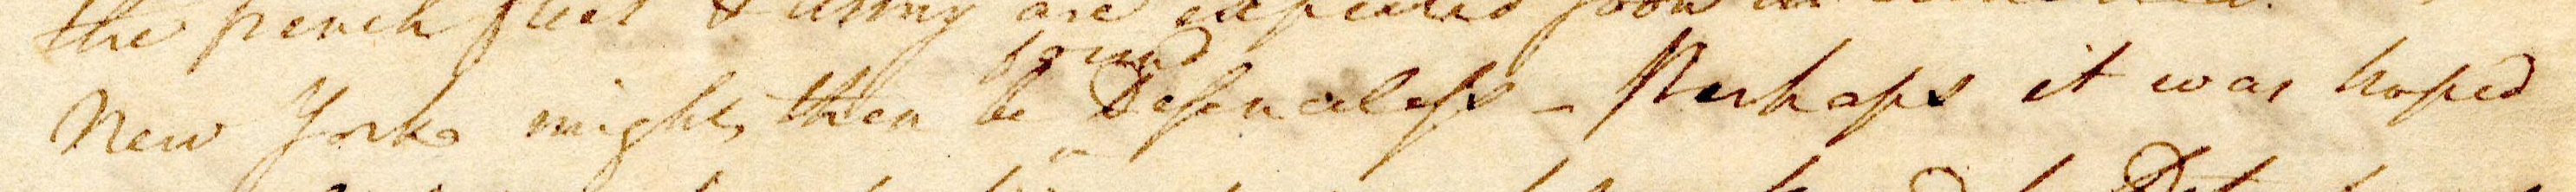New Yorke might then be ^ Defenceless. Perhaps it was hoped
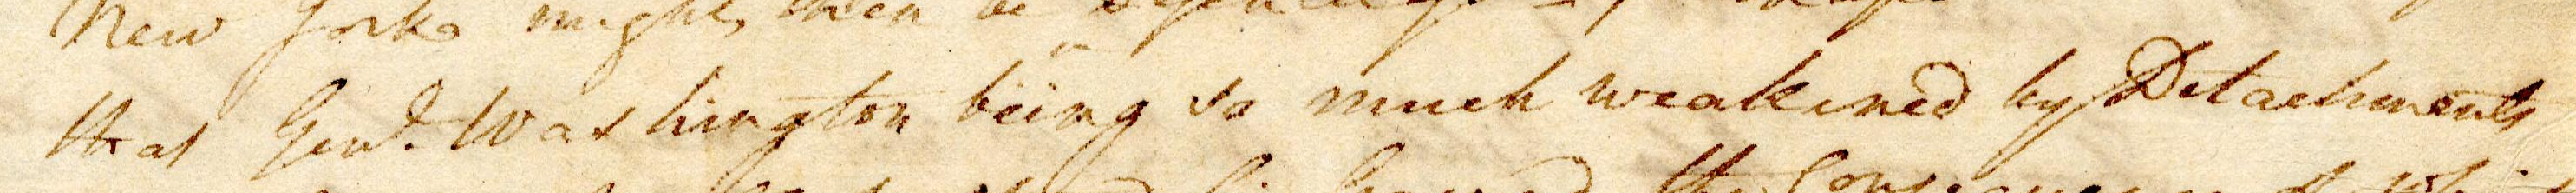that Gen^l. Washington being so much weakened by Detachment
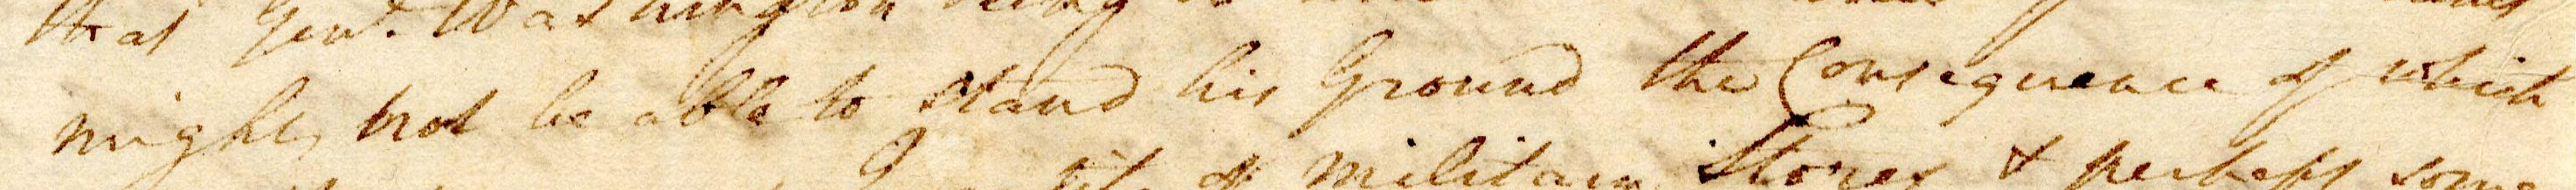might not be able to stand his Ground the Consequence of which
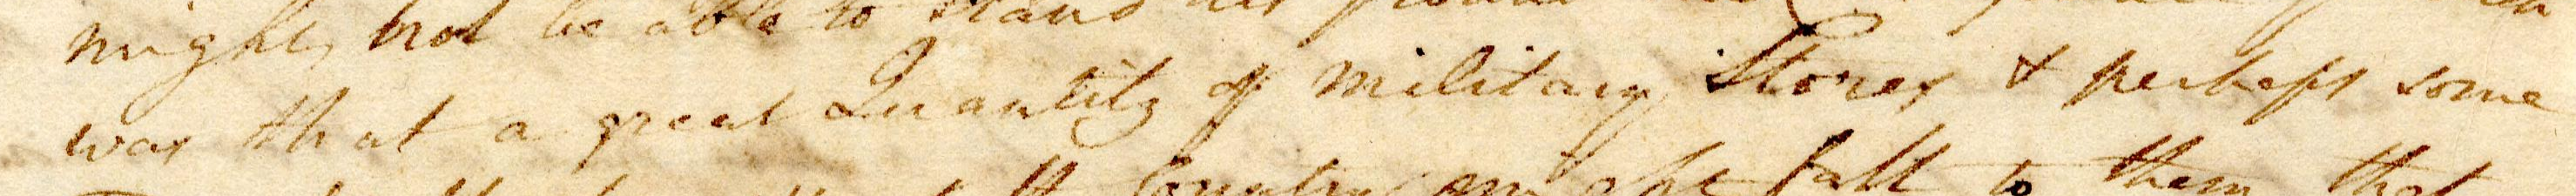was that a great Quantity of Military Stores & perhaps some
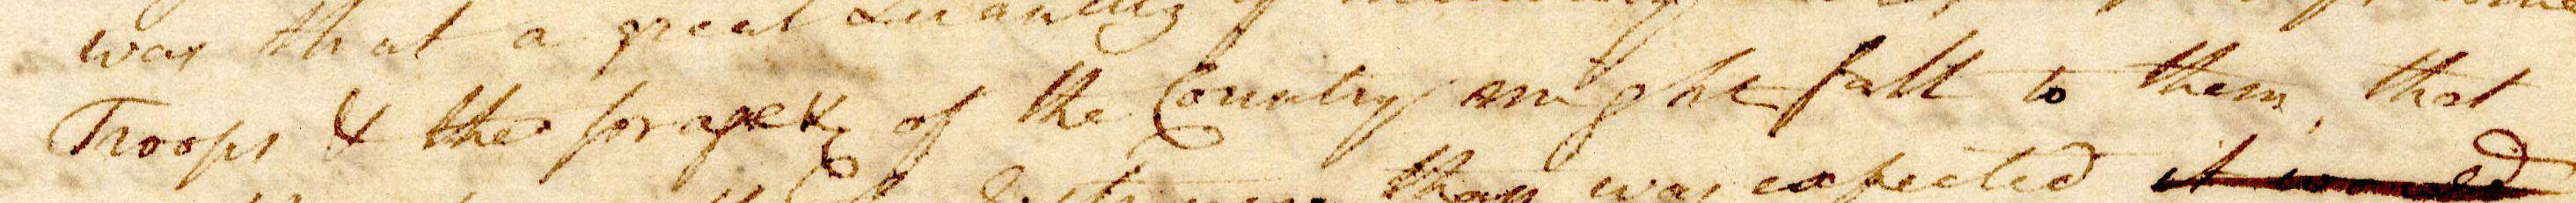Troops & the foraget of the Country might fall to them that
